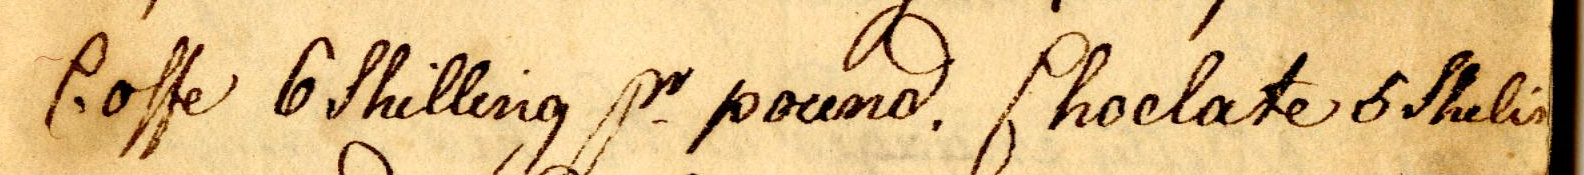Coffe 6 Shilling p^r pound. Choclate 5 Shilis
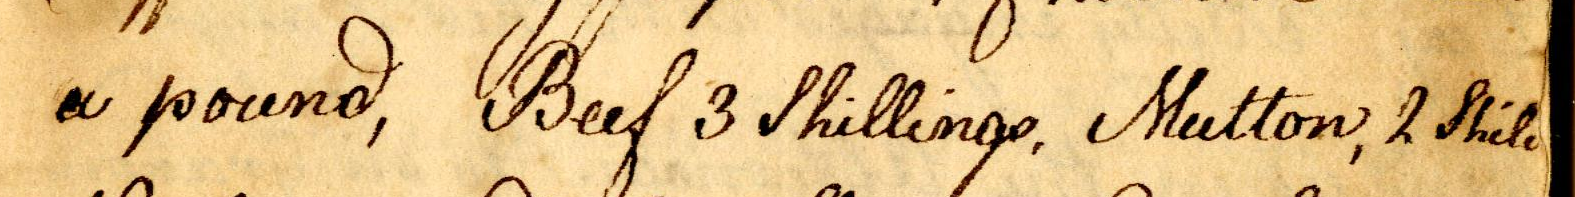a pound, Beef 3 Shillings, Mutton, 2 Shili
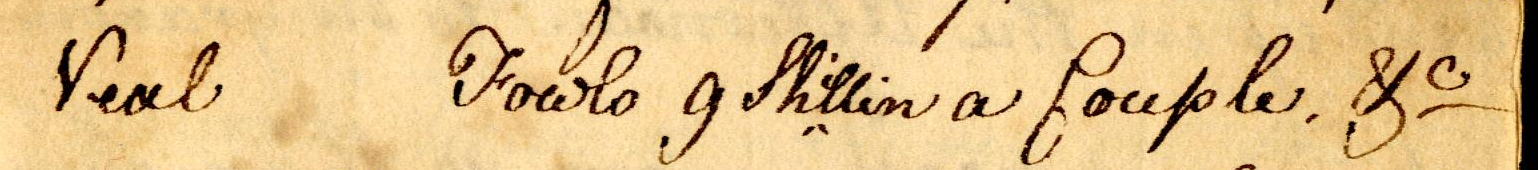Veal Fowls 9 Shillin a Couple. & ^c
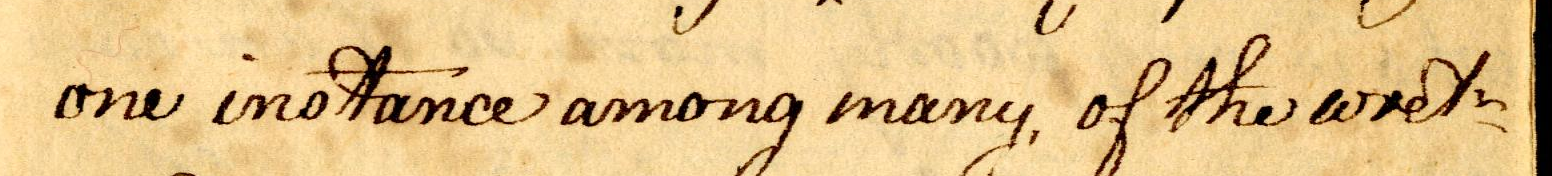one instance among many, of the wret-
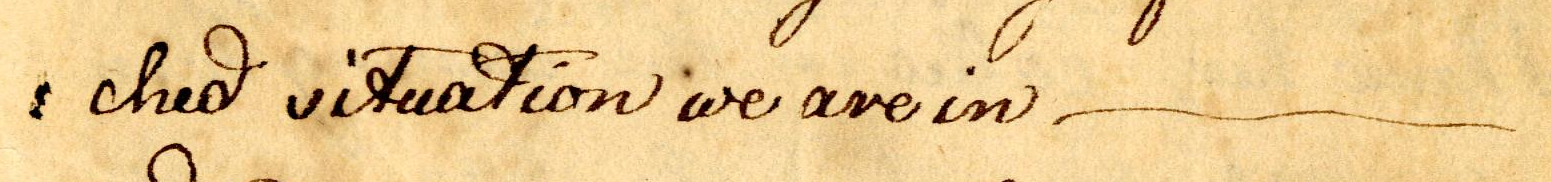-ched situation we are in-
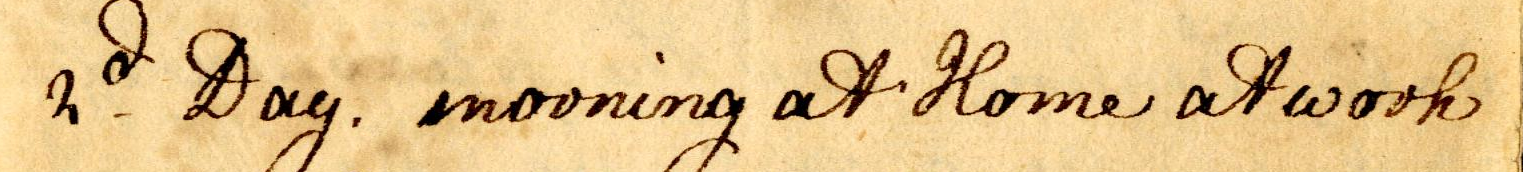2^d Day. morning at Home at work
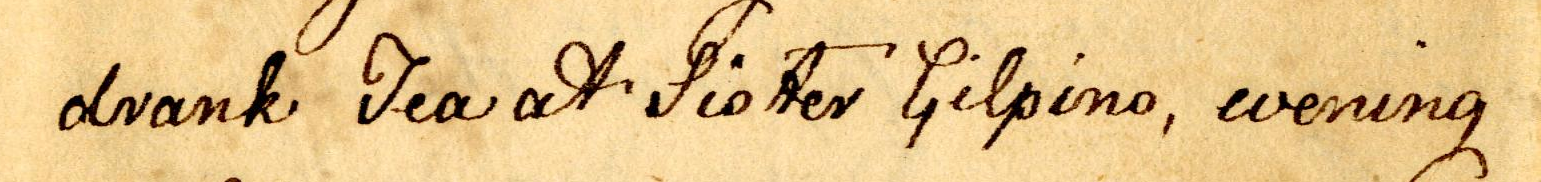drank Tea at Sister Gilpins, evening
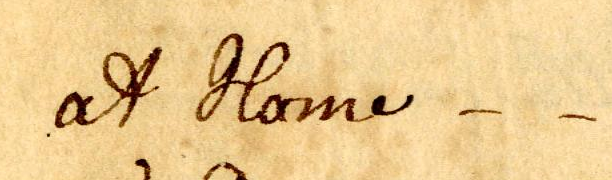at Home--
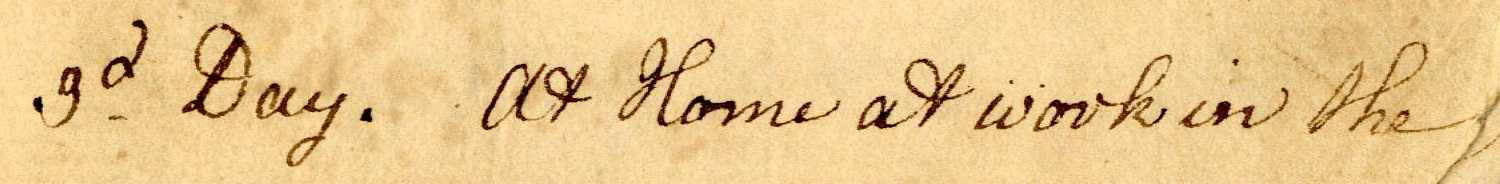3^d Day. At Home at work in the
